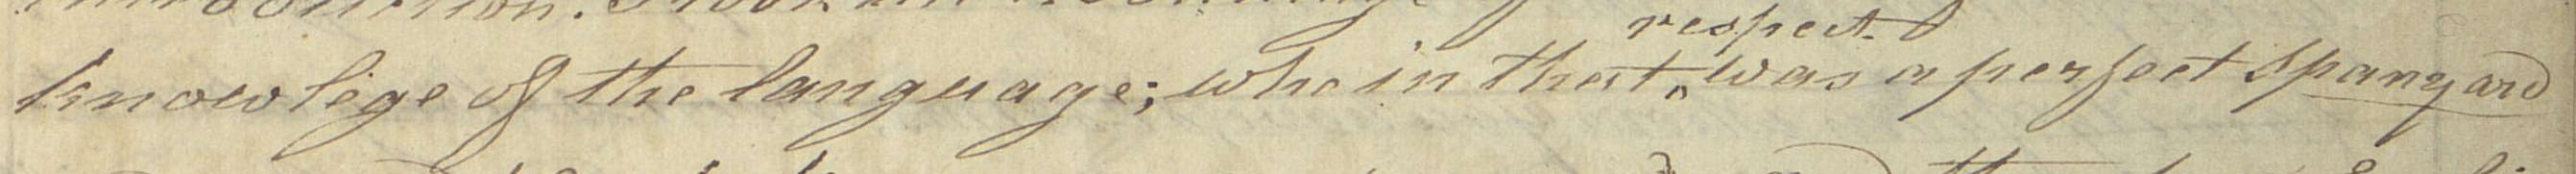knowlege of the language; who in that ^ was a perfect spanyard
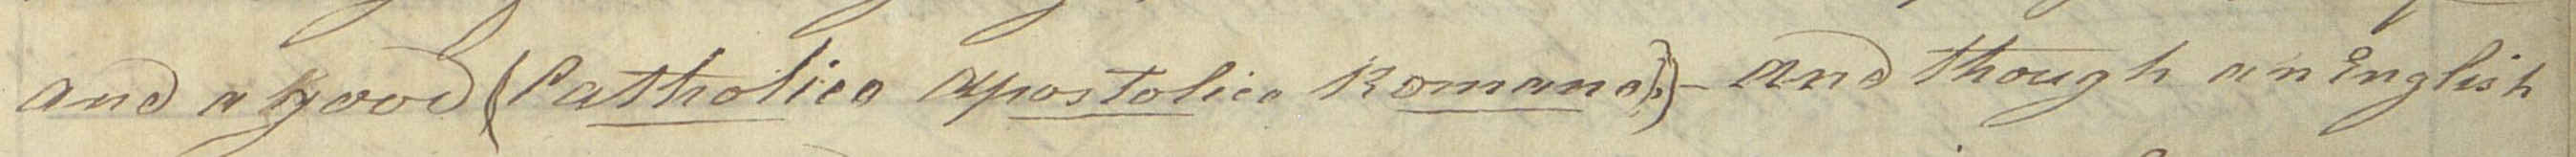and a good (Catholico Apostolico Romano) and though an English
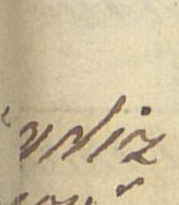-adiz
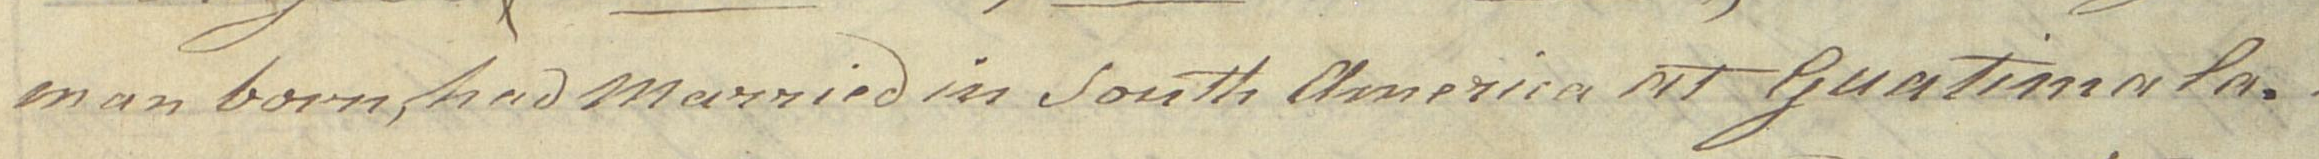man born, had Married in South America at Guatimala.
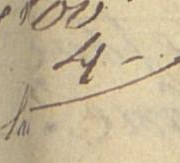Nov-^
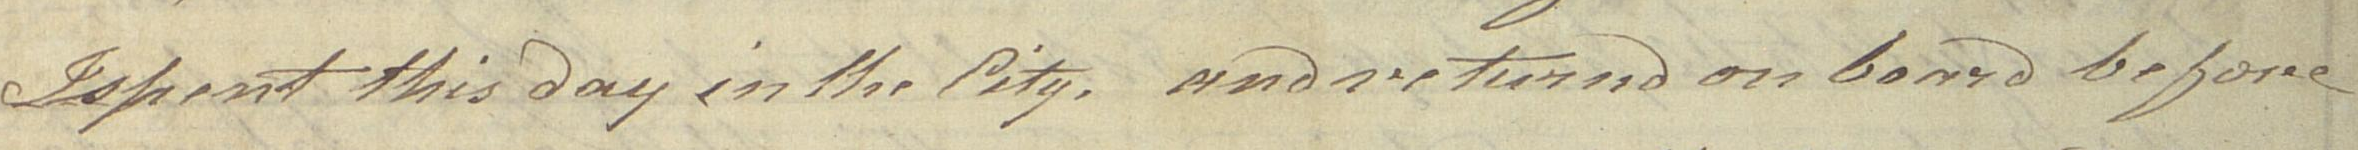I spent this day in the City, and returned on board before
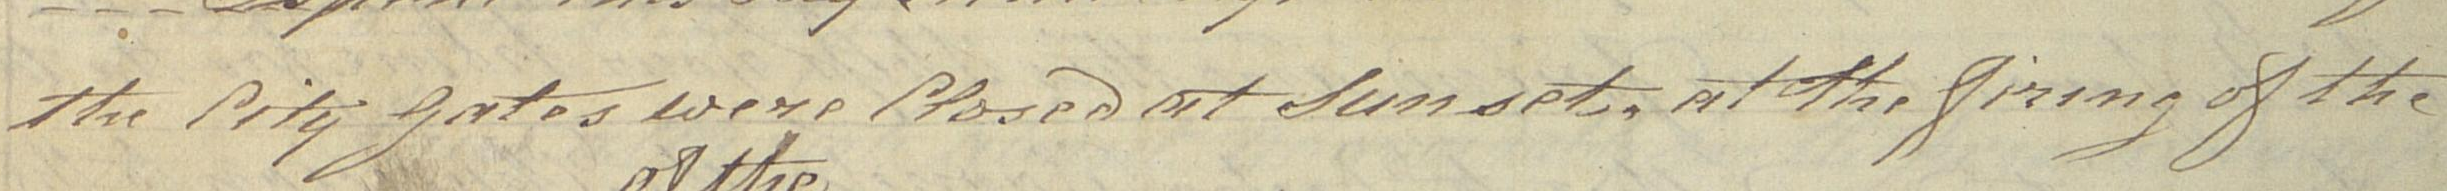the City Gates were Closed at sunset, at the firing of the
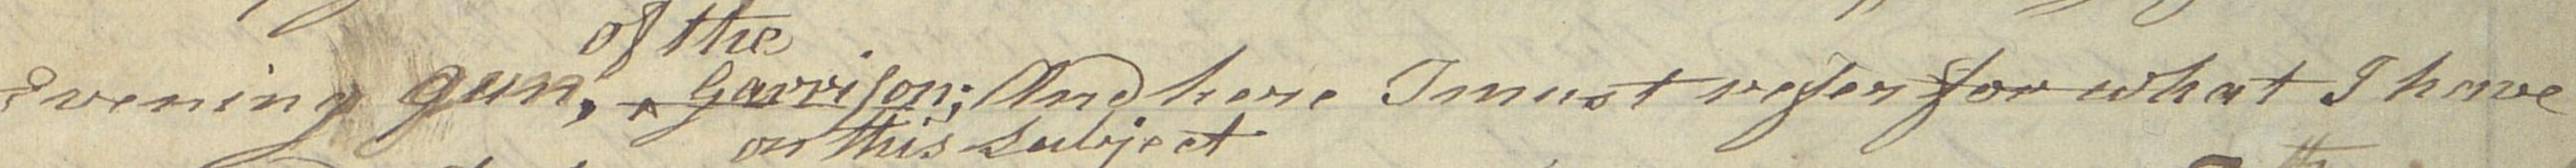Evening gun, ^ Garrison; And here I must refer for what I have
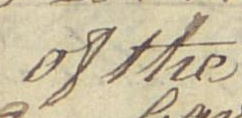of the
